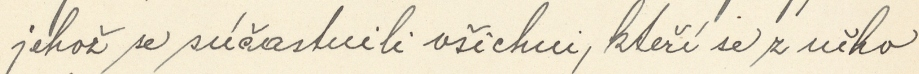jehož se súčastnili všichni, kteří se z něho
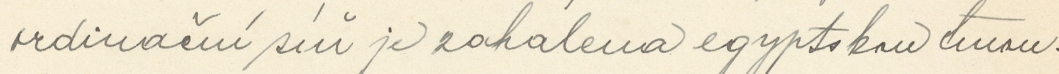ordinační síň je zahalena egyptskou tmou.
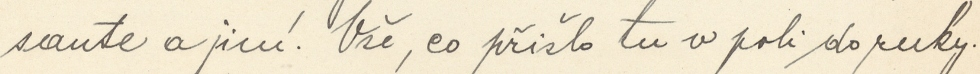sante a jiní. Vše, co přišlo tu v poli do ruky.
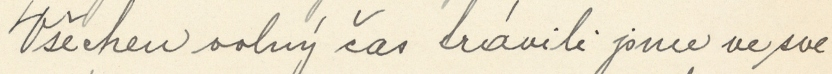Všechen volný čas trávili jsme ve své
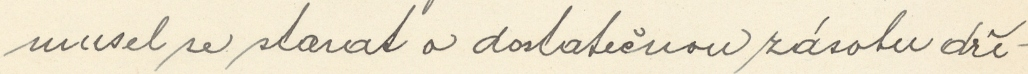musel se starat o dostatečnou zásobu dří-
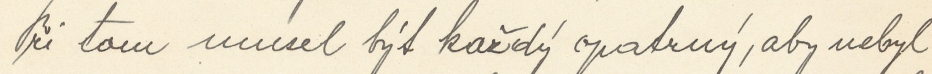Při tom musel být každý opatrný, aby nebyl
